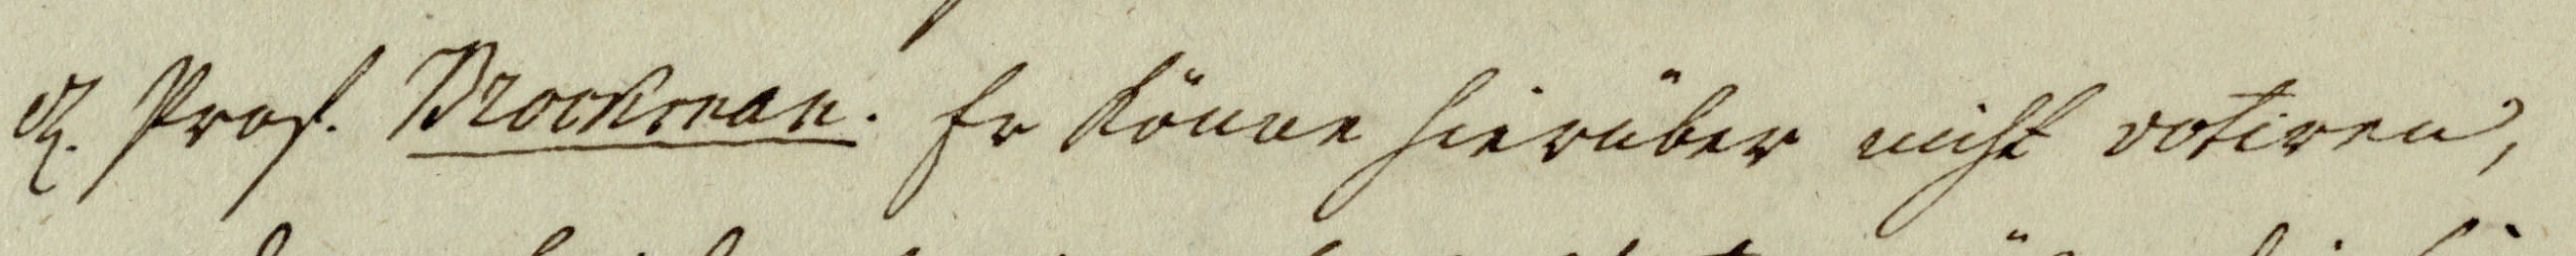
dh. Prof. Brockman. Er könne hierüber nicht votiren,
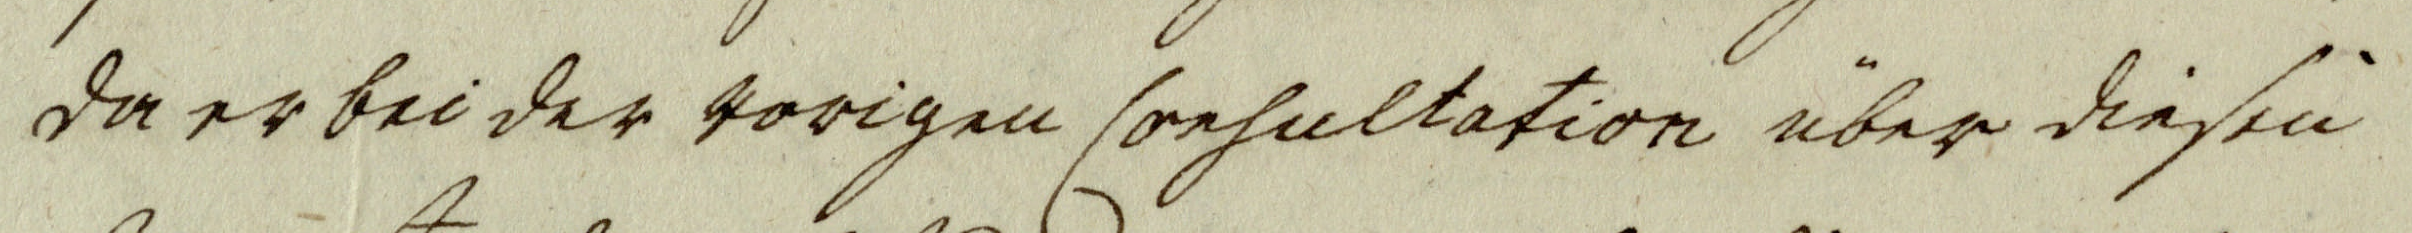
da er bei der vorigen Consultation über diesen
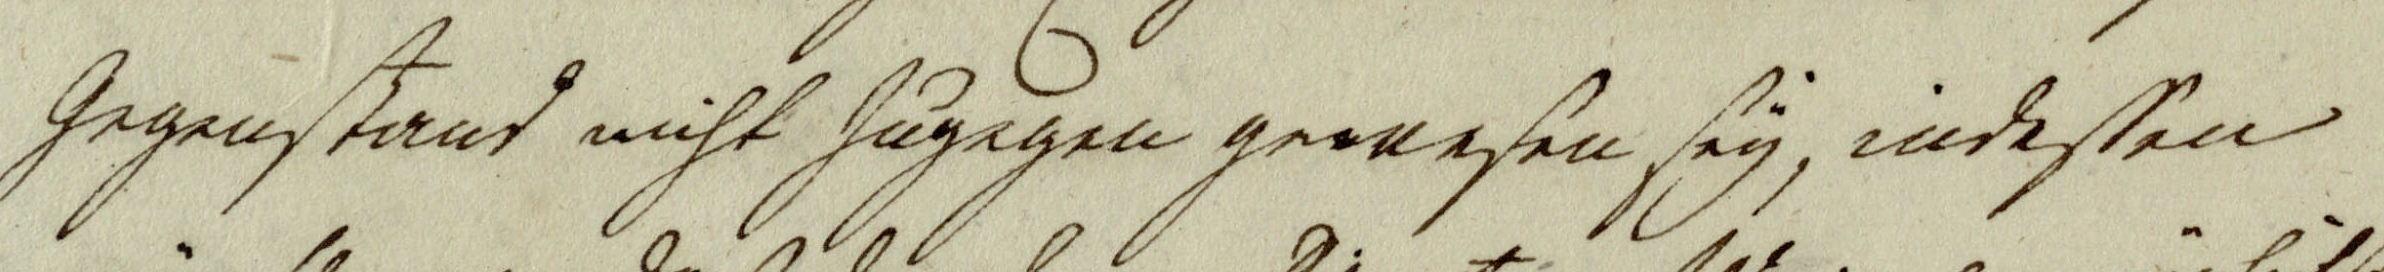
Gegenstand nicht zugegen gewesen seÿ, indessen
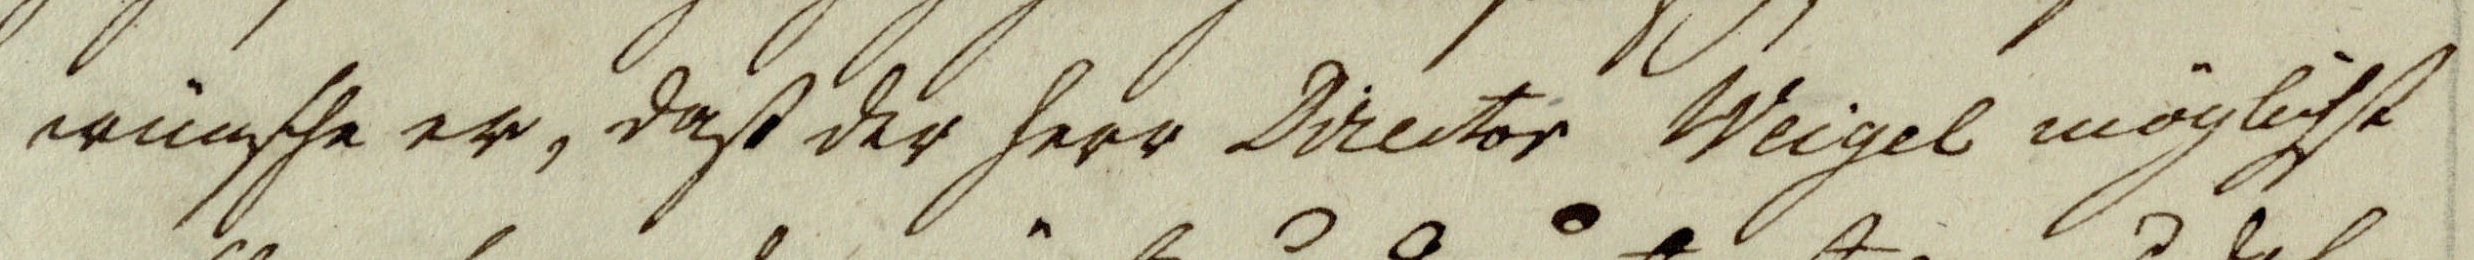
wünsche er, daß der Herr Director Weigel möglichst
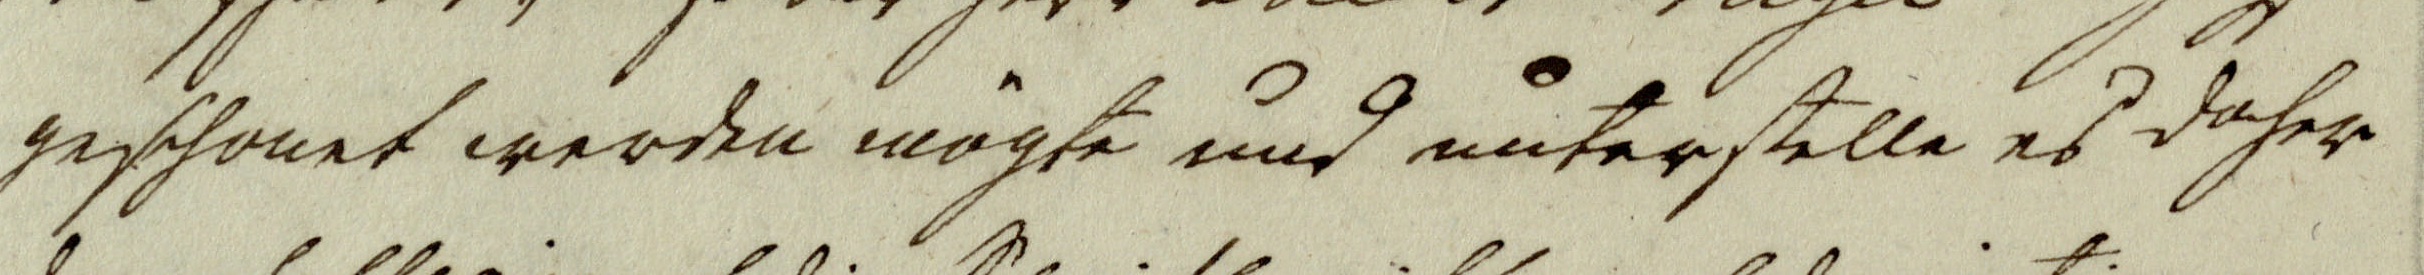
geschonet werden mögte und unterstellte es daher
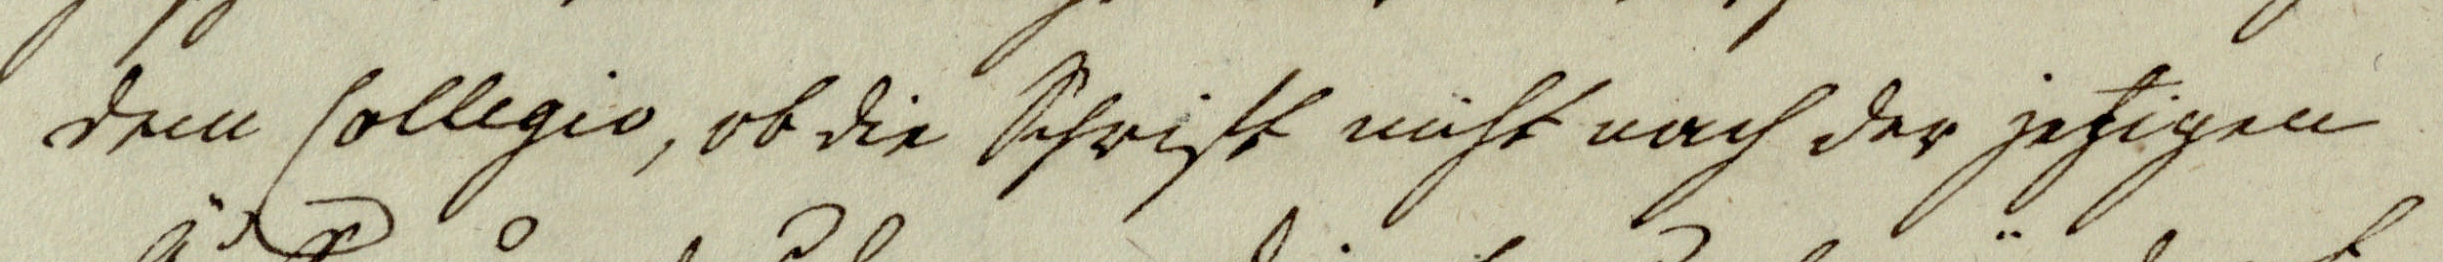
dem Collegio, ob die Schrift nicht nach der jetzigen
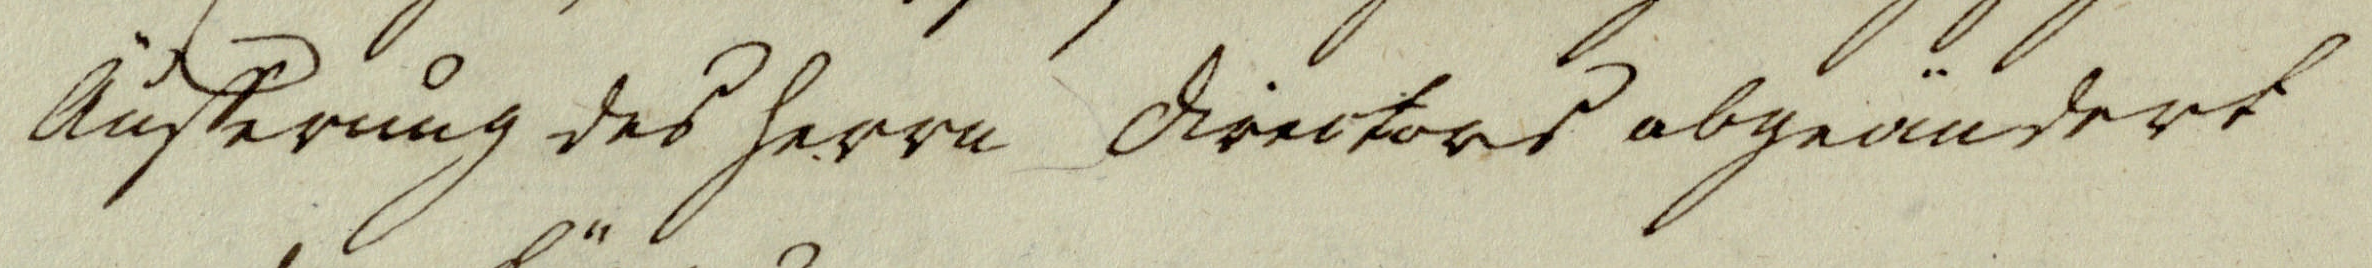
Äusserung des Herrn Directors abgeändert
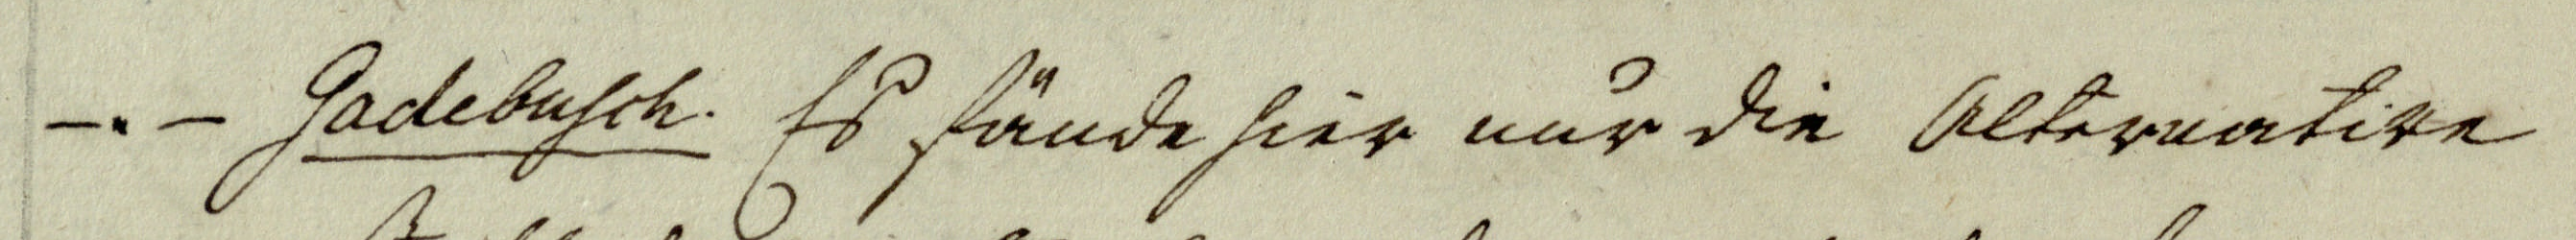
Gadebusch. Es fände hier nur die Alternative
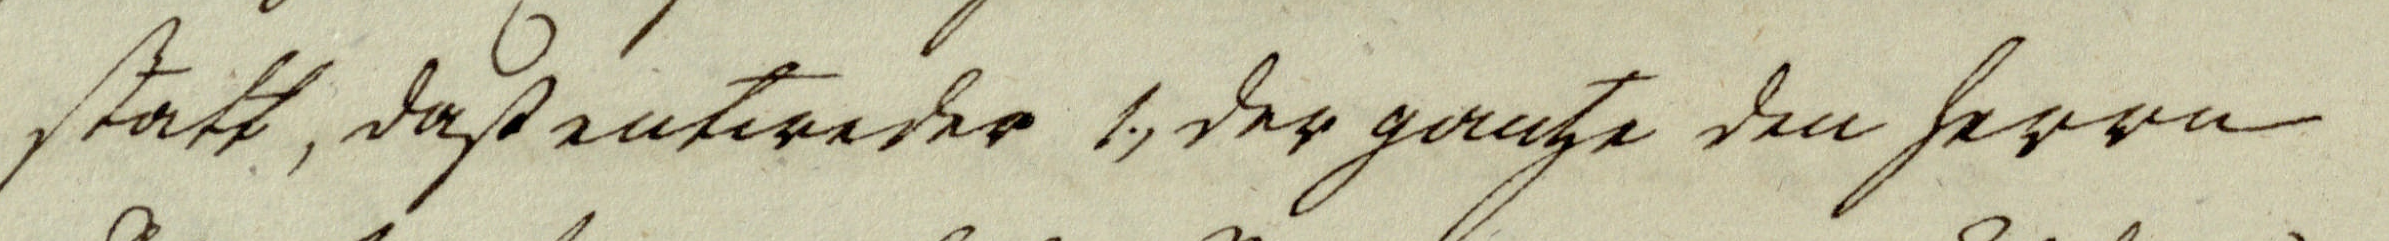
statt, daß entweder 1., der gantze den Herrn
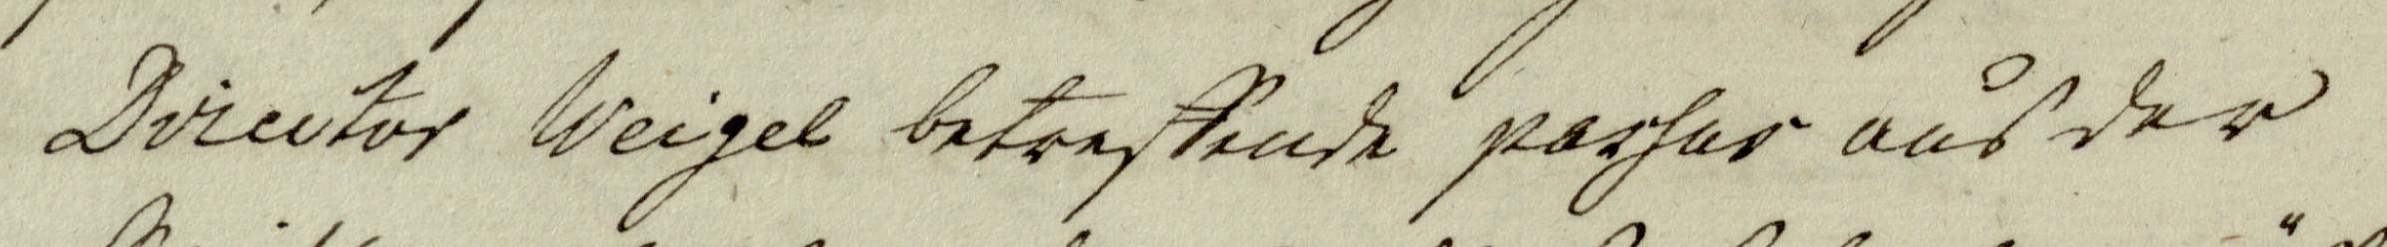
Director Weigel betreffende passus aus der
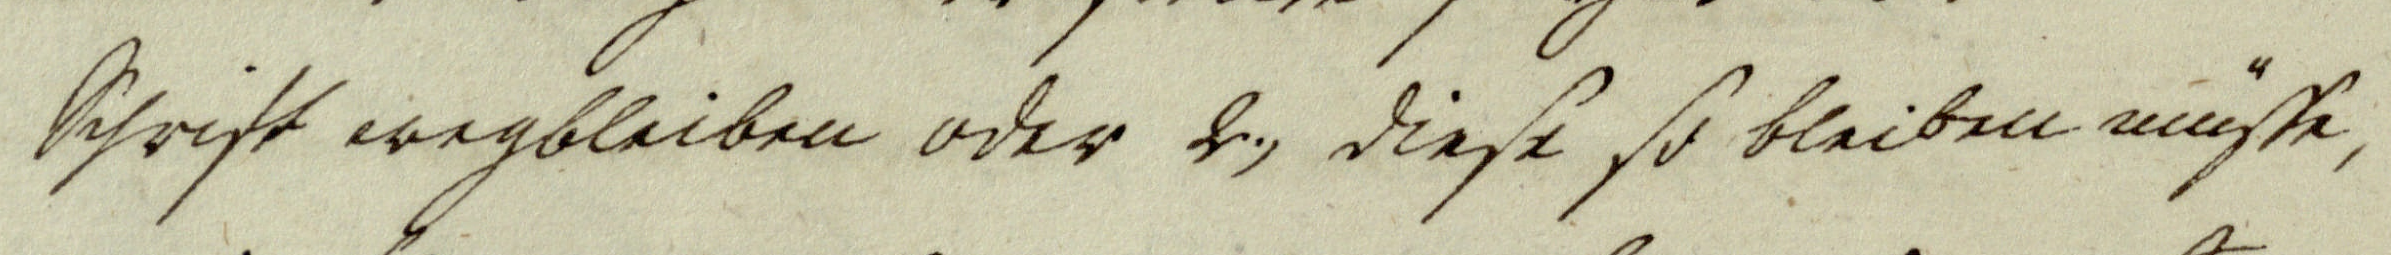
Schrift wegbleiben oder 2., diese so bleiben müsse,
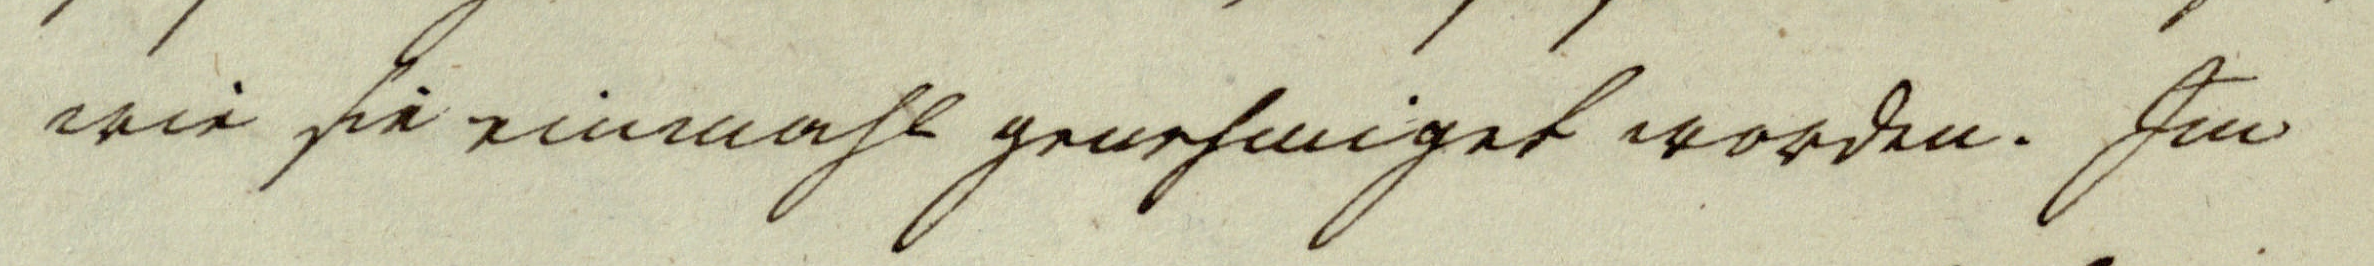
wie sie einmahl genehmiget worden. Im
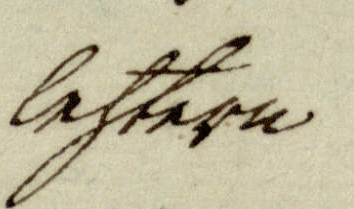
letztern
